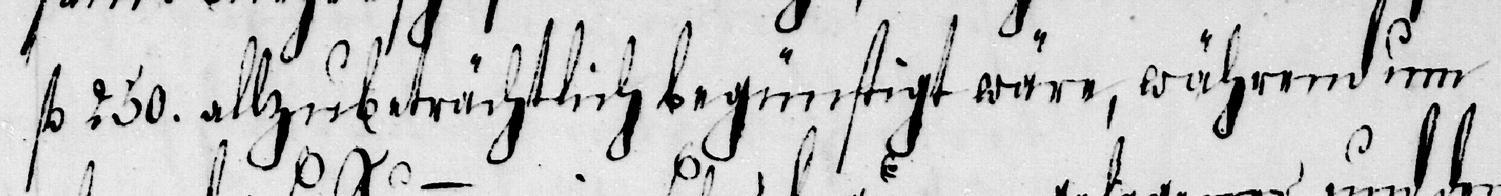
fl. 250. allzubeträchtlich begünstigt wäre, während um
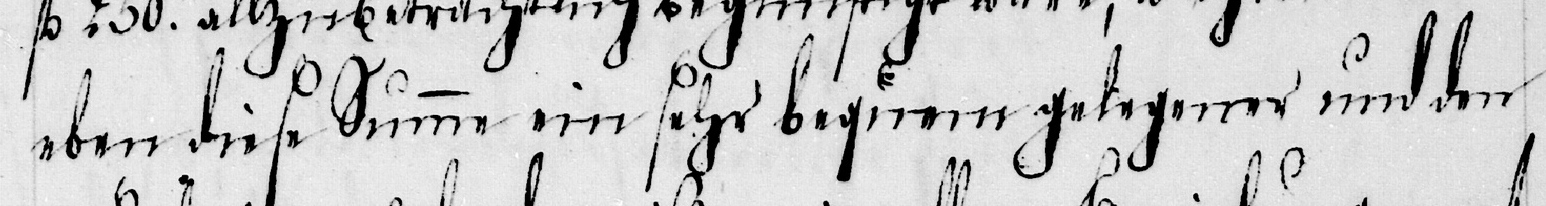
eben diese Summe ein sehr bequem gelegener und den
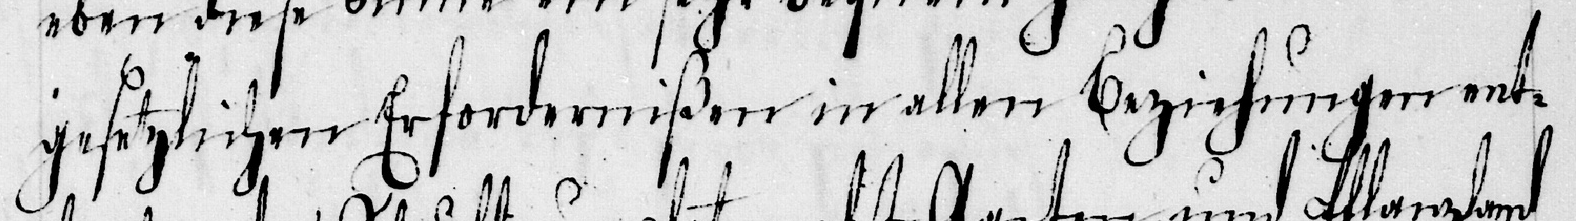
gesetzlichen Erfordernißen in allen Beziehungen ent¬
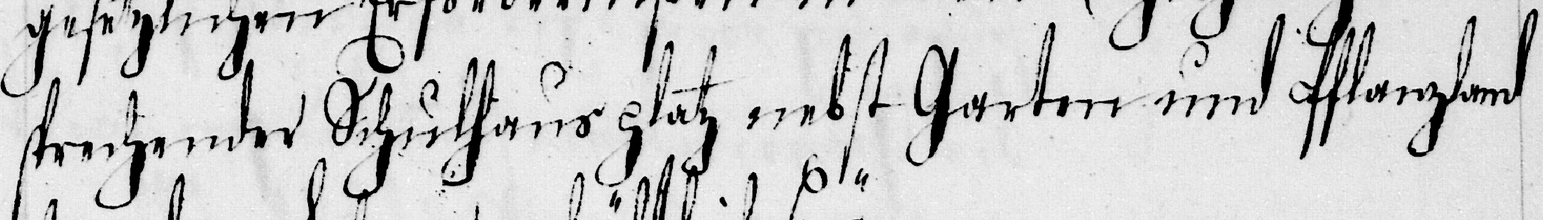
sprechender Schulhausplatz nebst Garten und Pflanzland
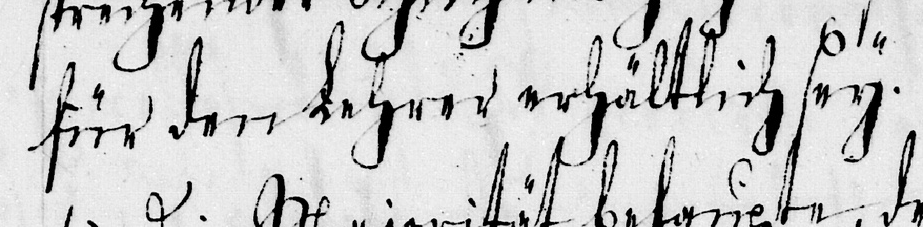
für den Lehrer erhältlich sey.
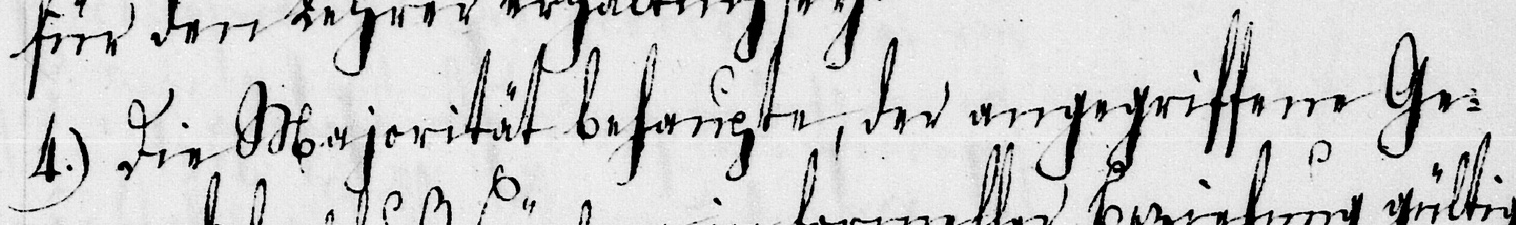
4.) Die Majorität behaupte, der angegriffene Ge¬
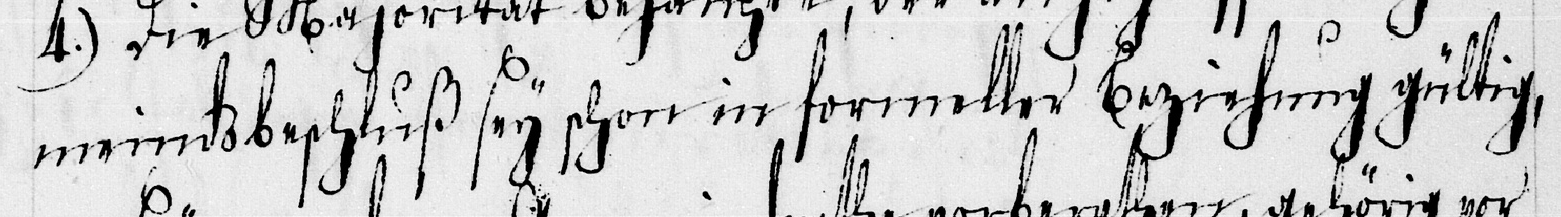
meindsbeschluß sey schon in formeller Beziehung gültig,
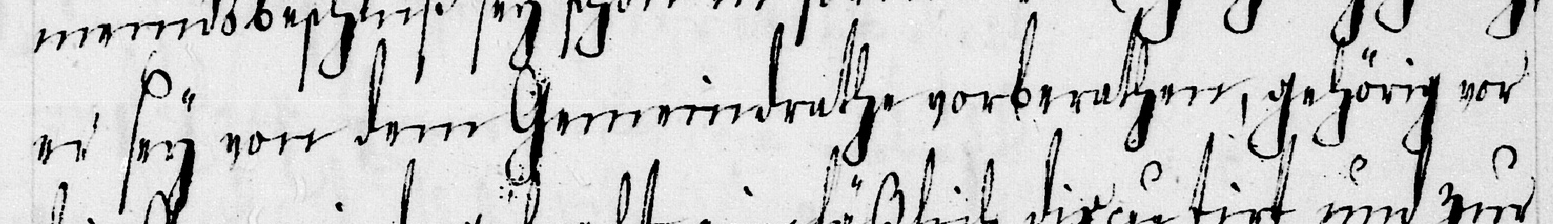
er sey von dem Gemeindrathe vorberathen, gehörig vor
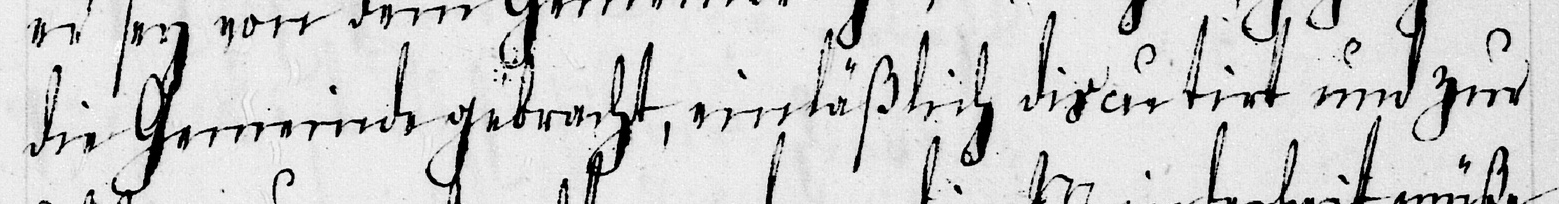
die Gemeinde gebracht, einläßlich discutirt und zur
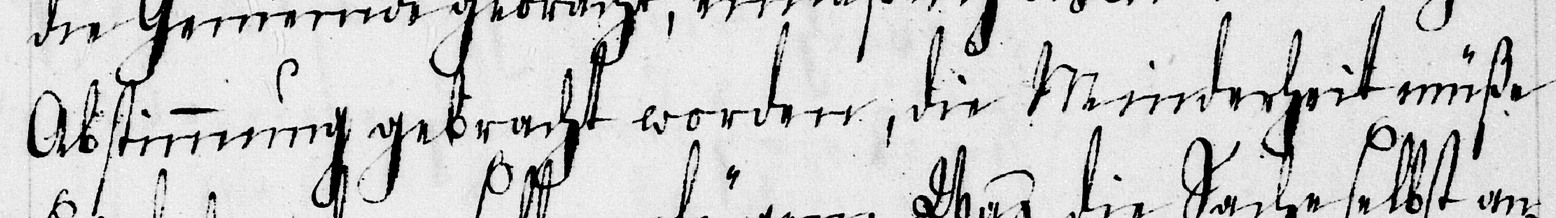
Abstimmung gebracht worden, die Minderheit müße
